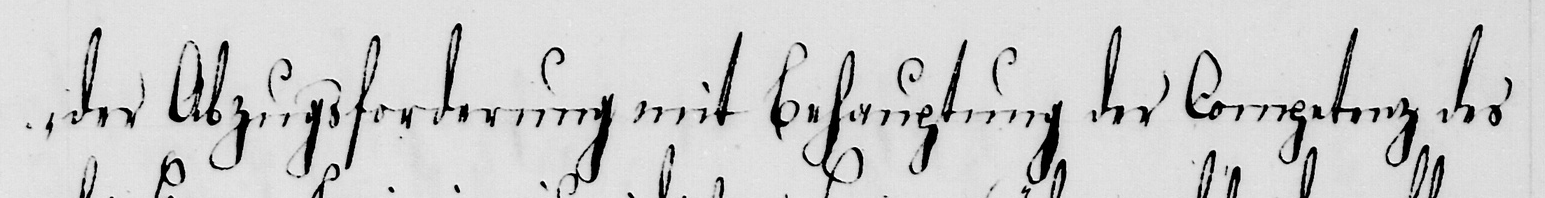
der Abzugsforderung mit Behauptung der Competenz des
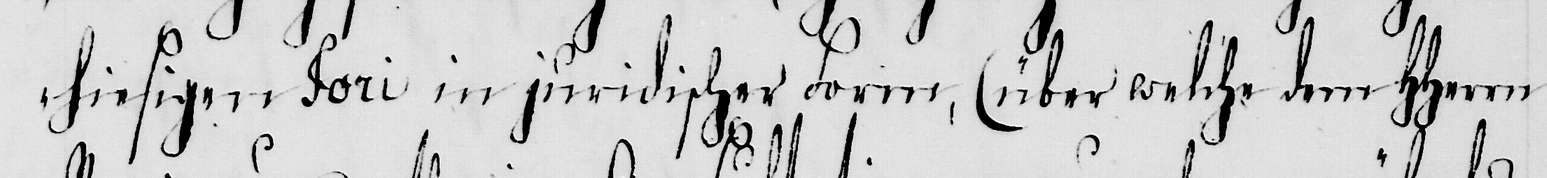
hiesigen Fori in juridischer Form, (über welche dem HHerrn
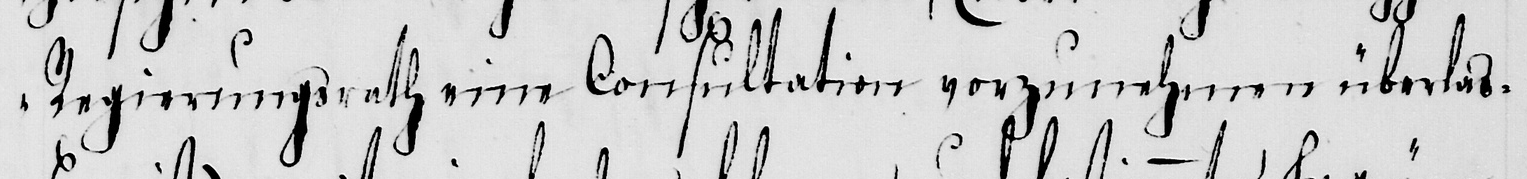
Regierungsrath eine Consultation vorzunehmen überlaß¬
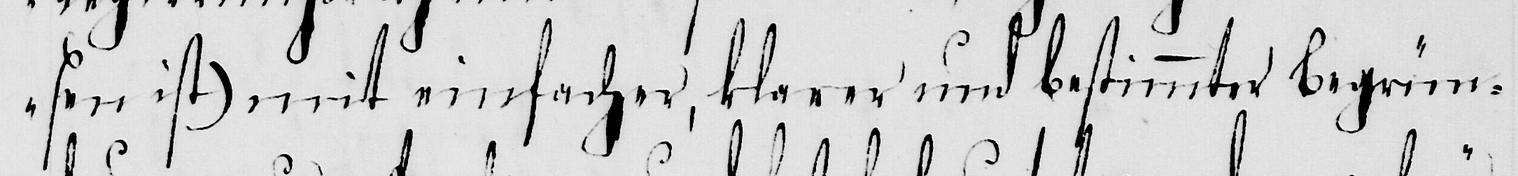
en ist) mit einfacher, klarer und bestimmter Begrün¬
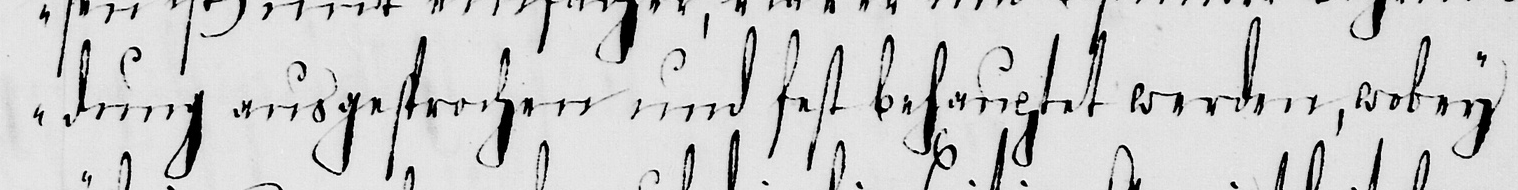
dung ausgesprochen und fest behauptet werden, wobey
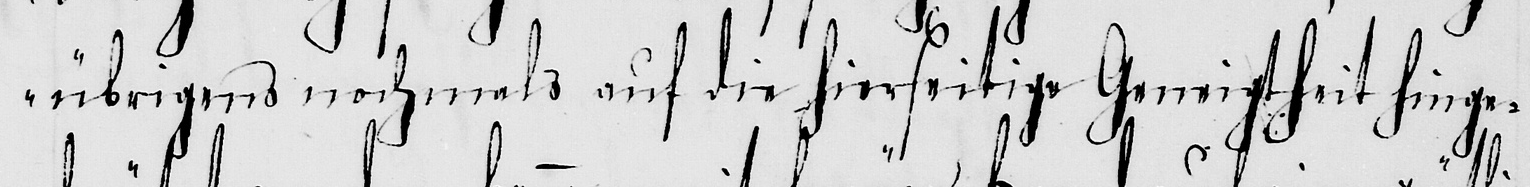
übrigens nochmals auf die hierseitige Geneigtheit hinge¬
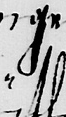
d.
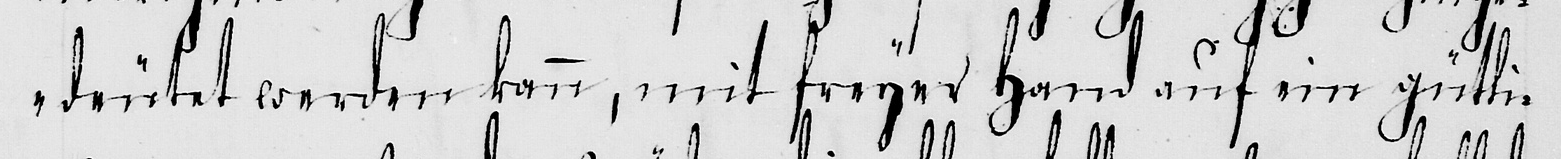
deutet werden kann, mit freyer Hand auf ein gütli¬
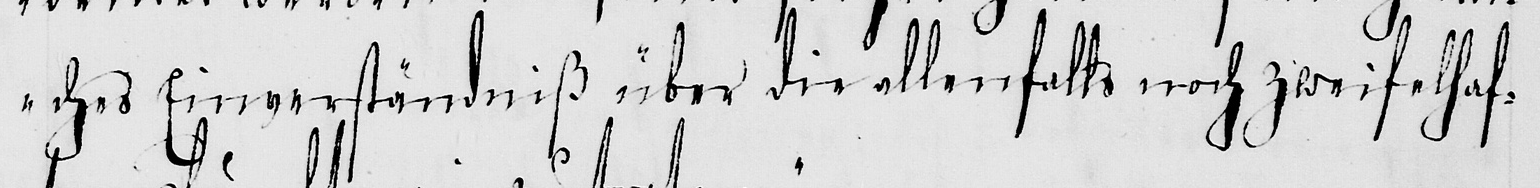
ches Einverständniß über die allenfalls noch zweifelhaf¬
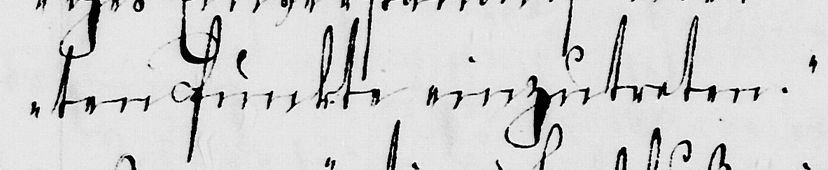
ten Punkte einzutreten.“
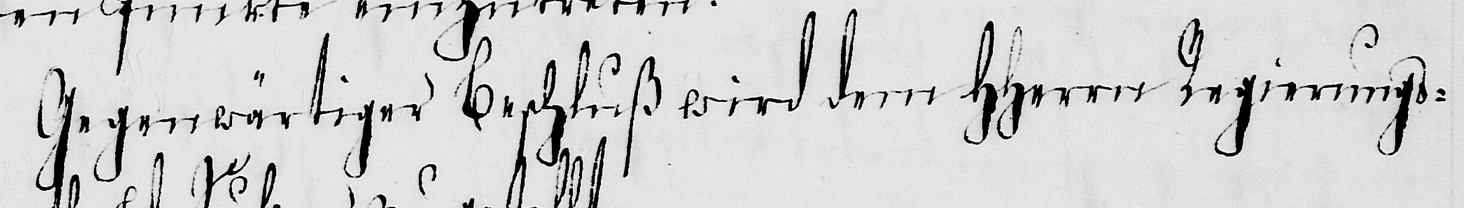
Gegenwärtiger Beschluß wird dem HHerrn Regierungs¬
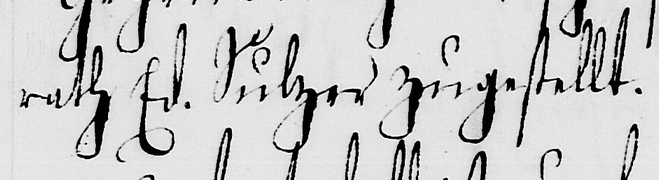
rath Ed. Sulzer zugestellt.
